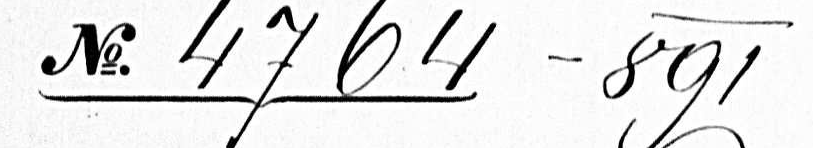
No 4764– 1891
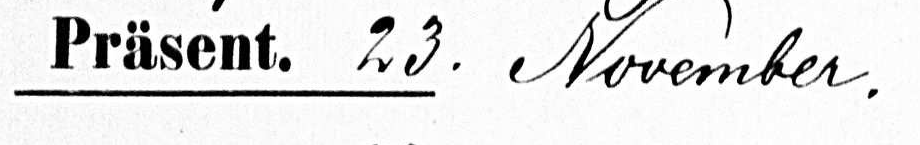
Präsent. – 23. November
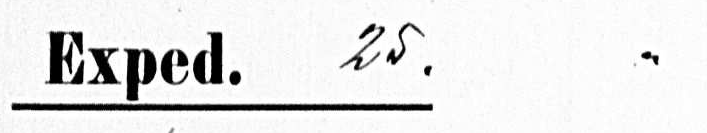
Exped. – 25. „
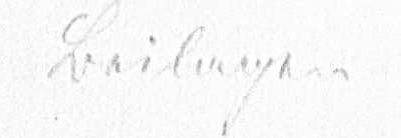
Beilagen
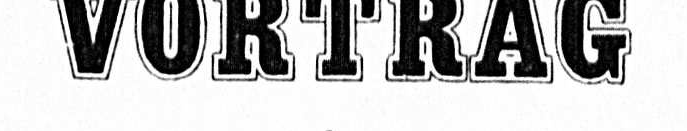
VORTRAG
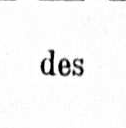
des
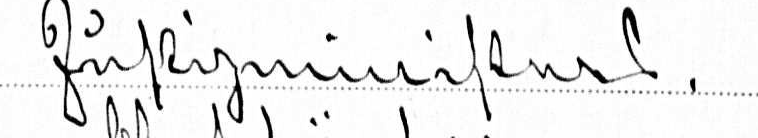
Justizministers,
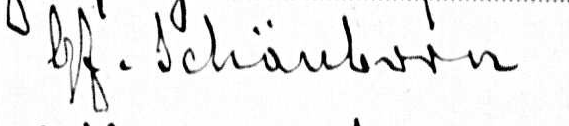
Gf. Schönborn
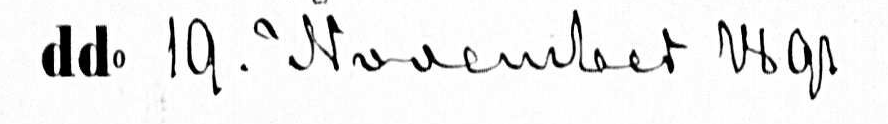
ddo 19. November 1891
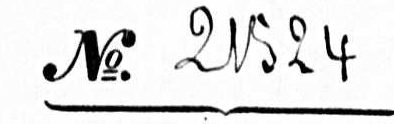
No. 21524
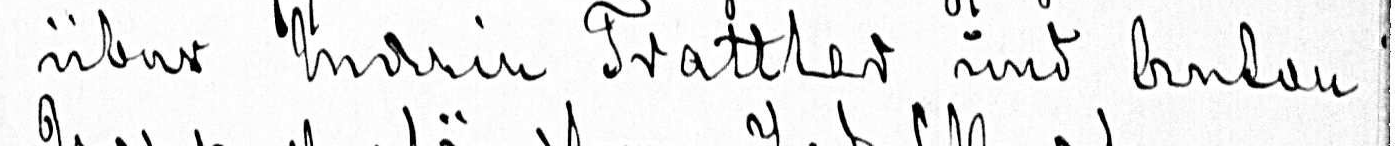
über Marie Trattler und Anton
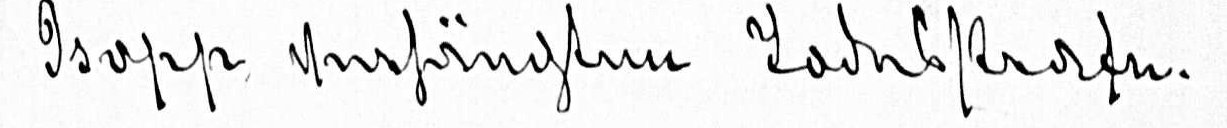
Isopp verhängten Todesstrafe.
